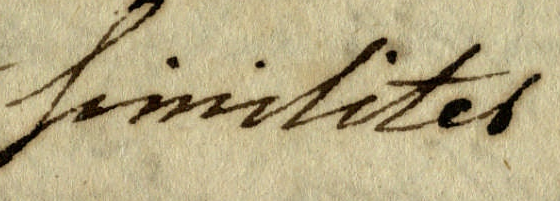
similiter
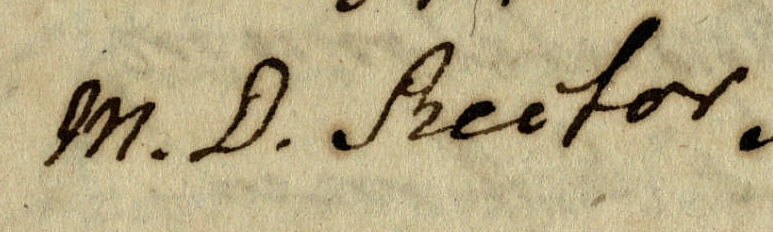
M. D. Rector
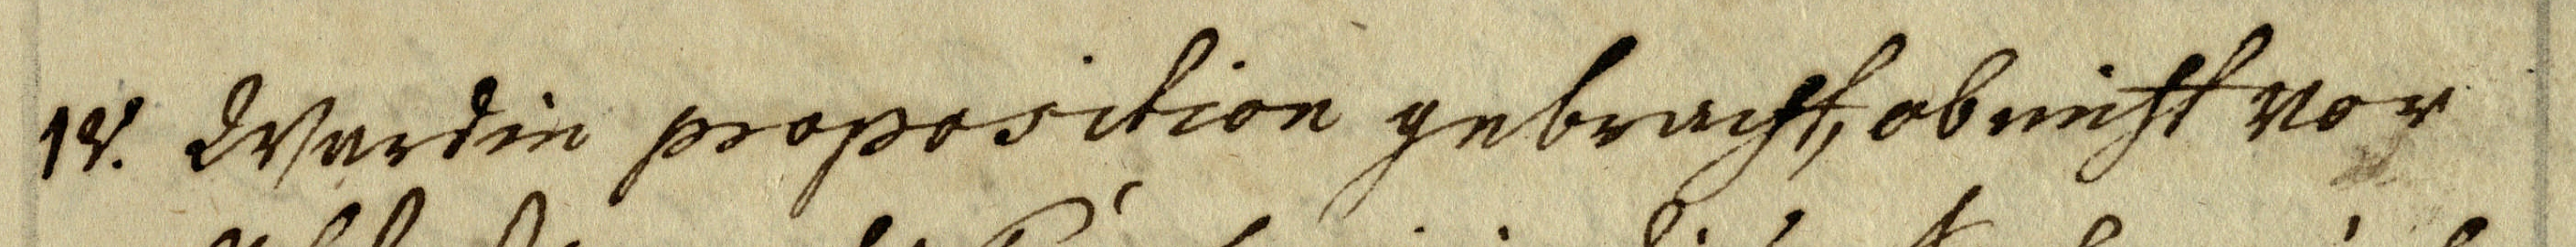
IV. Ward in proposition gebracht, ob nicht vor
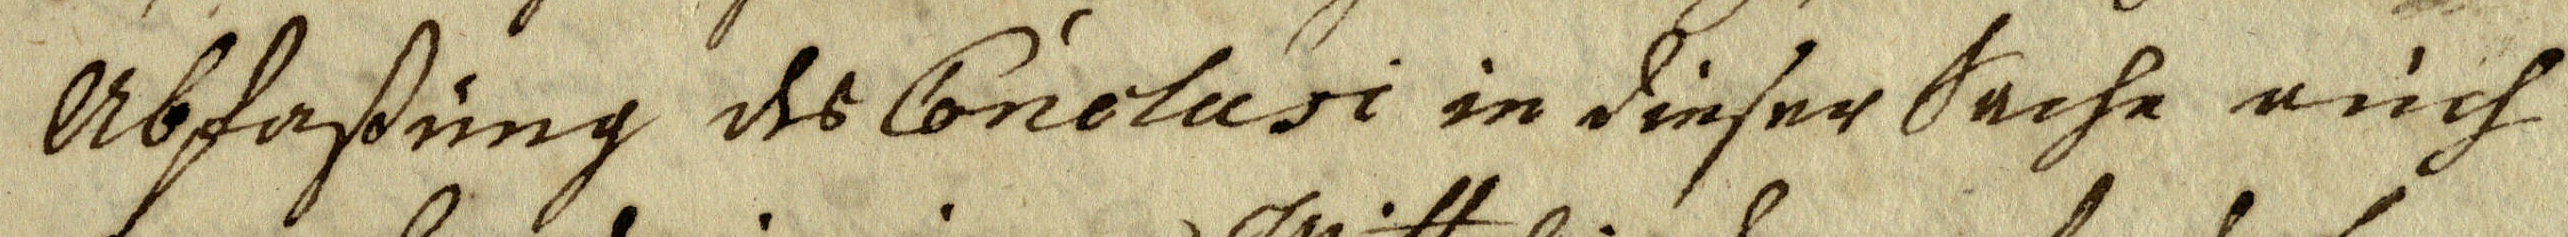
Abfaßung des Conclusi in dieser Sache auch
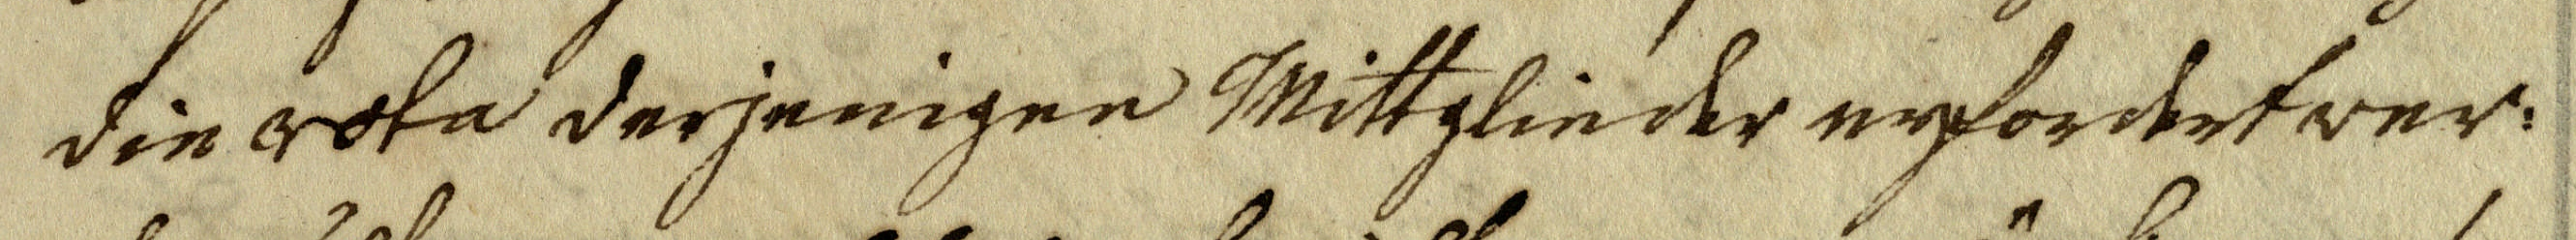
die vota derjenigen Mitglieder erfordert wer¬
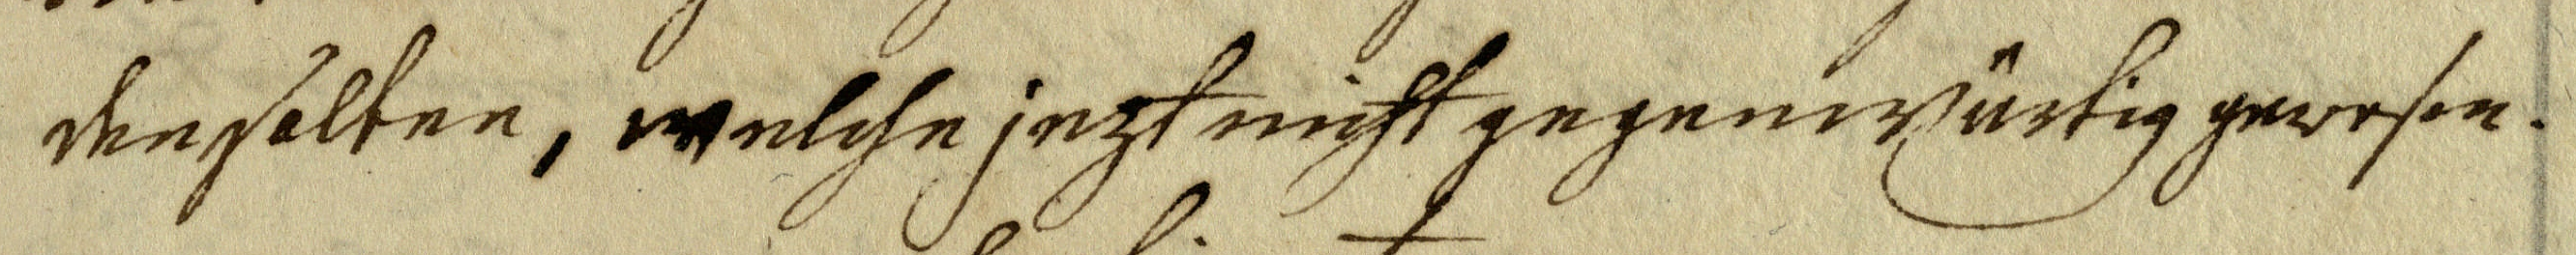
den solten, welche jezt nicht gegenwärtig gewesen.
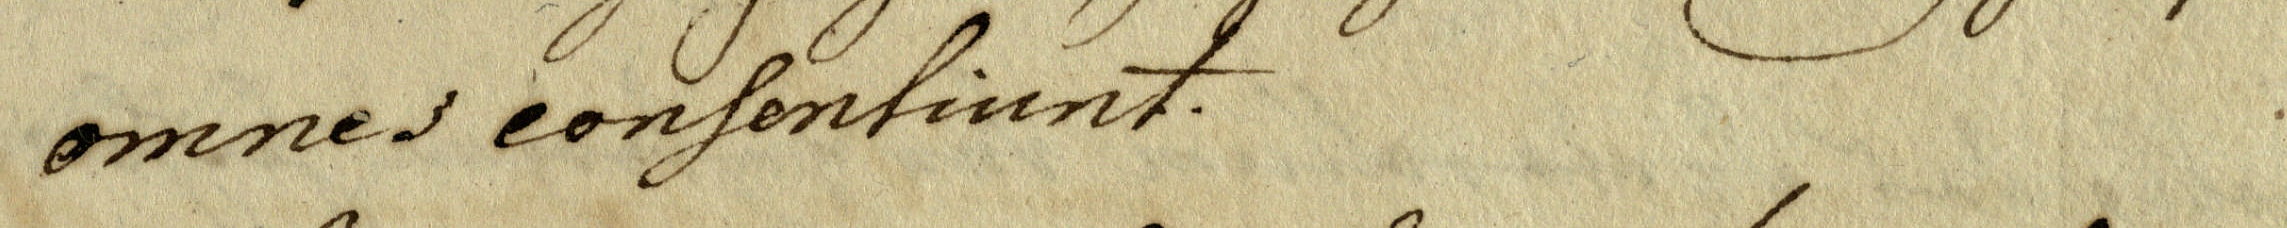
omnes consentiunt.
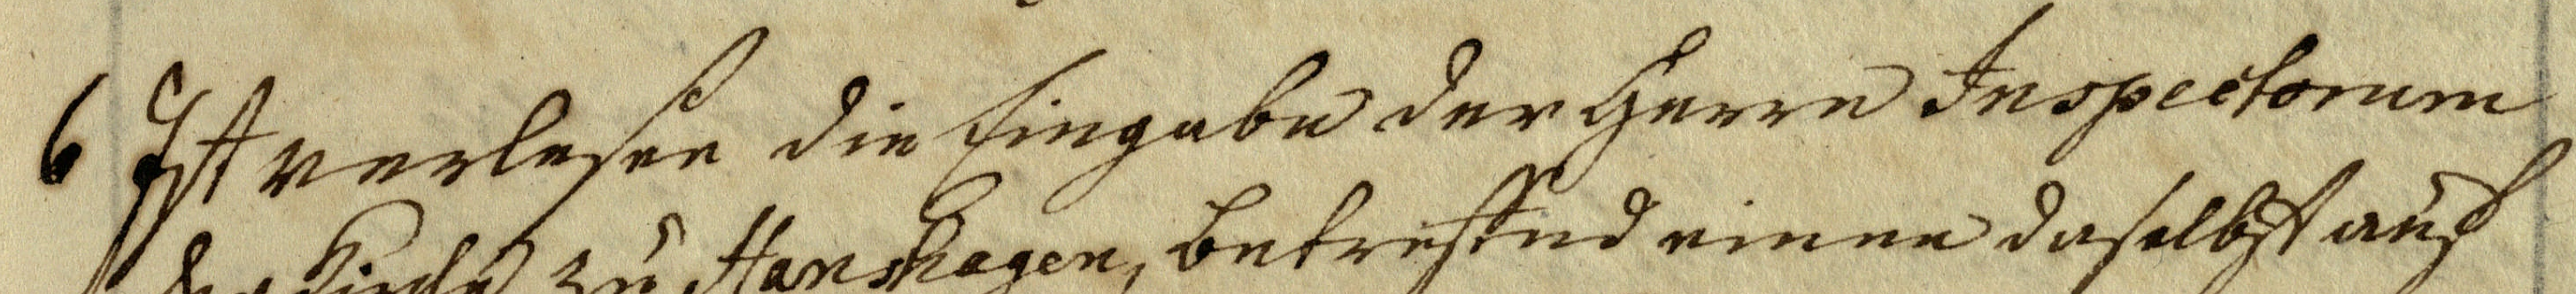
6 Ist verlesen die Eingabe der Herrn Inspectorum
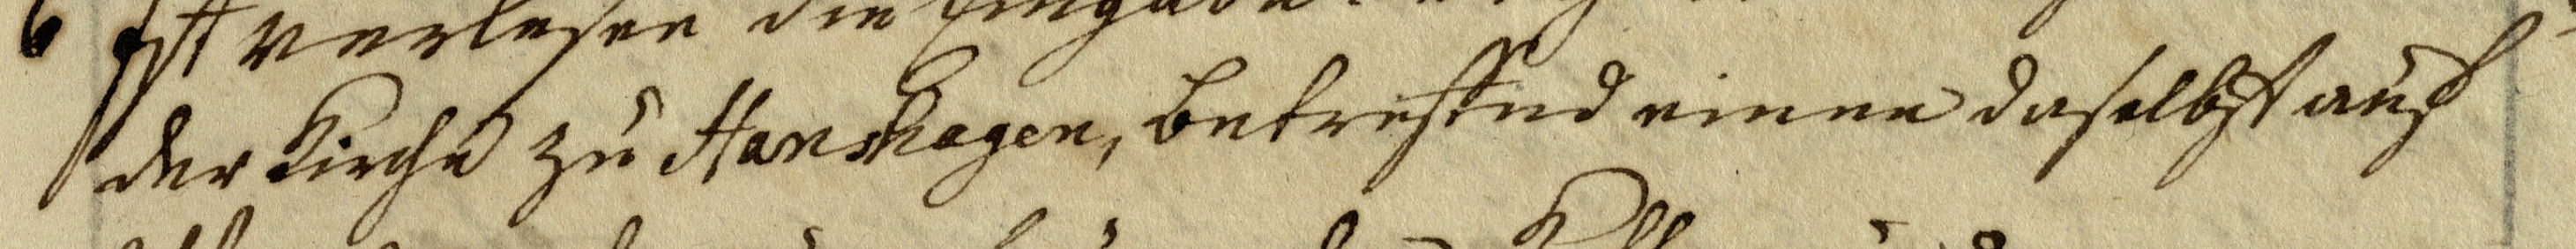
der Kirche zu Hanshagen, betreffend einen daselbst auf
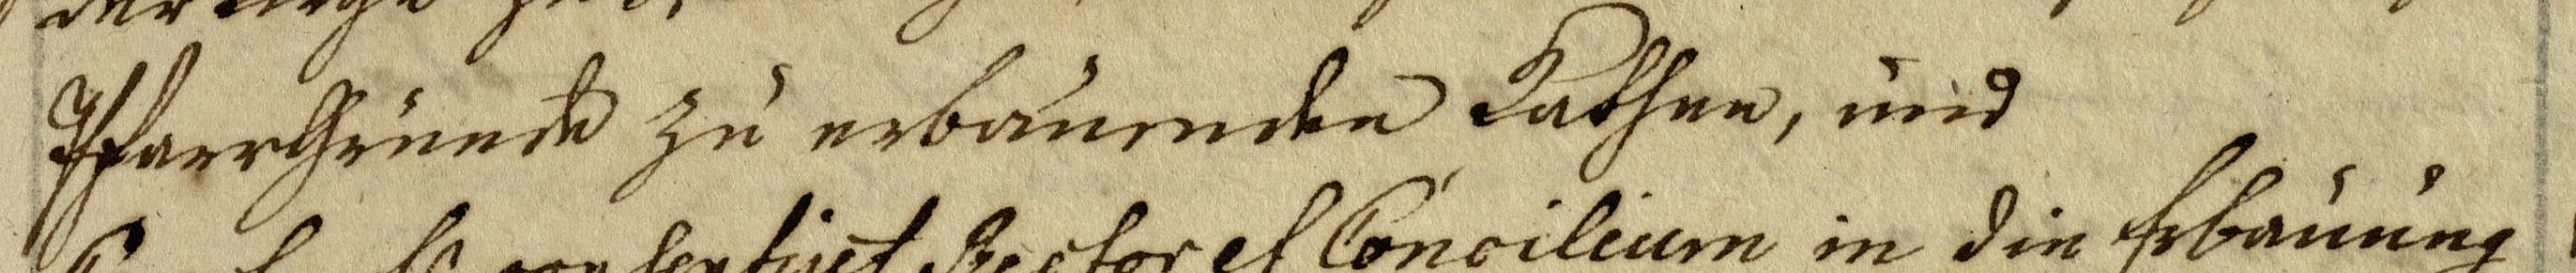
Pfarrgründe zu erbauenden Kathen, und
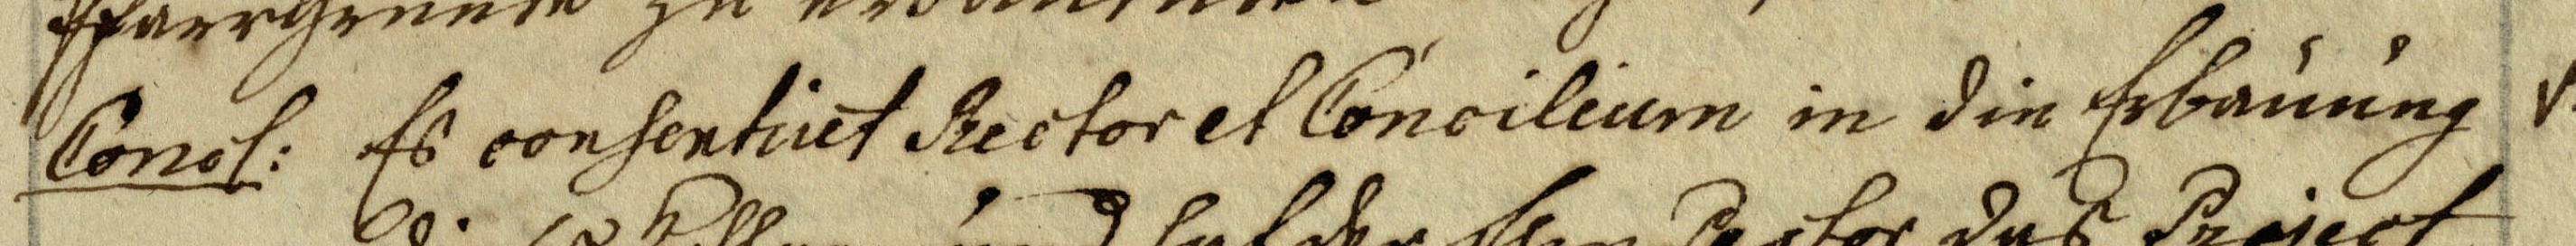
Concl. Es consentiret Rector et Concilium in die Erbauung
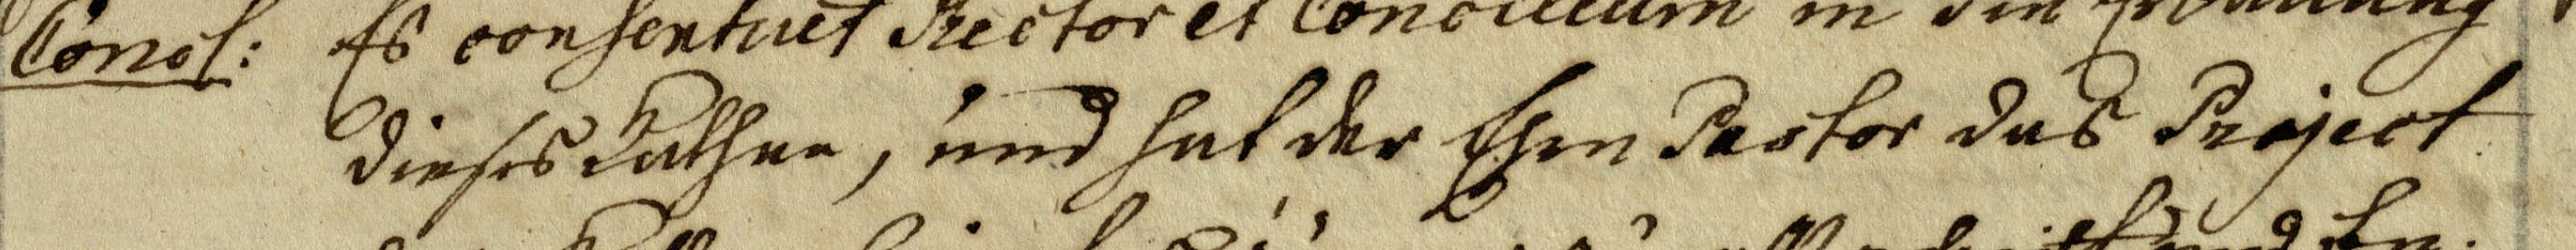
dieses Kathen, und hat der Ehm Pastor das Project
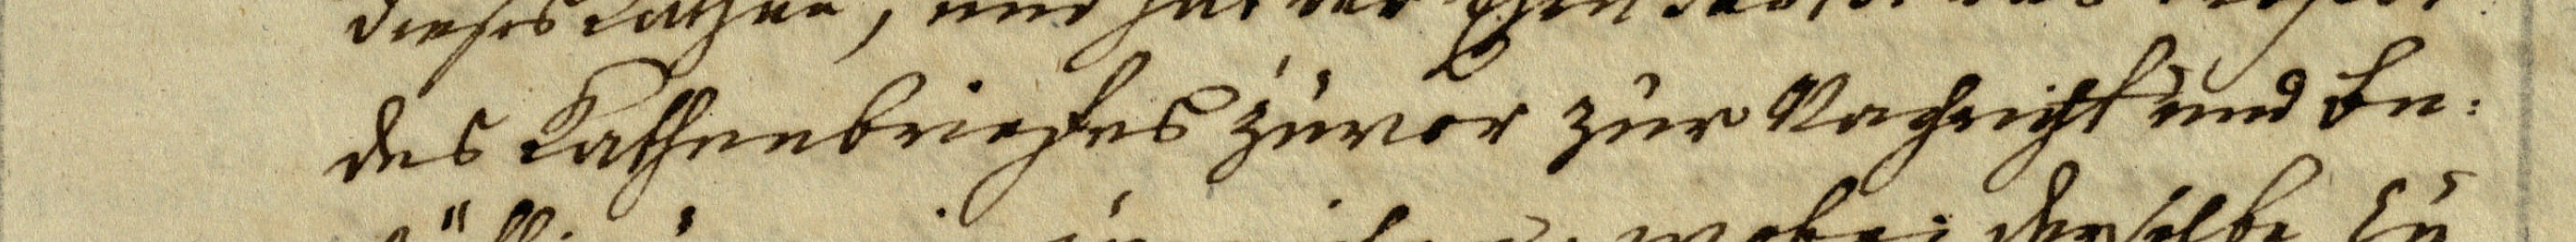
des Kathenbriefes zuvor zur Nachricht und Be¬
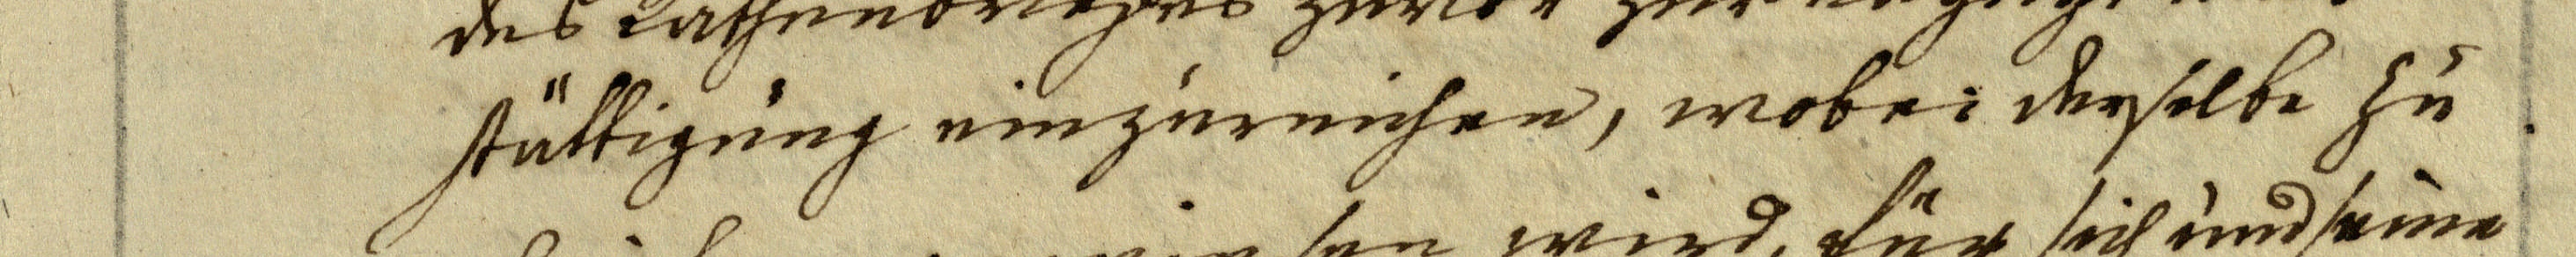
stättigung einzureichen, wobei derselbe zu¬
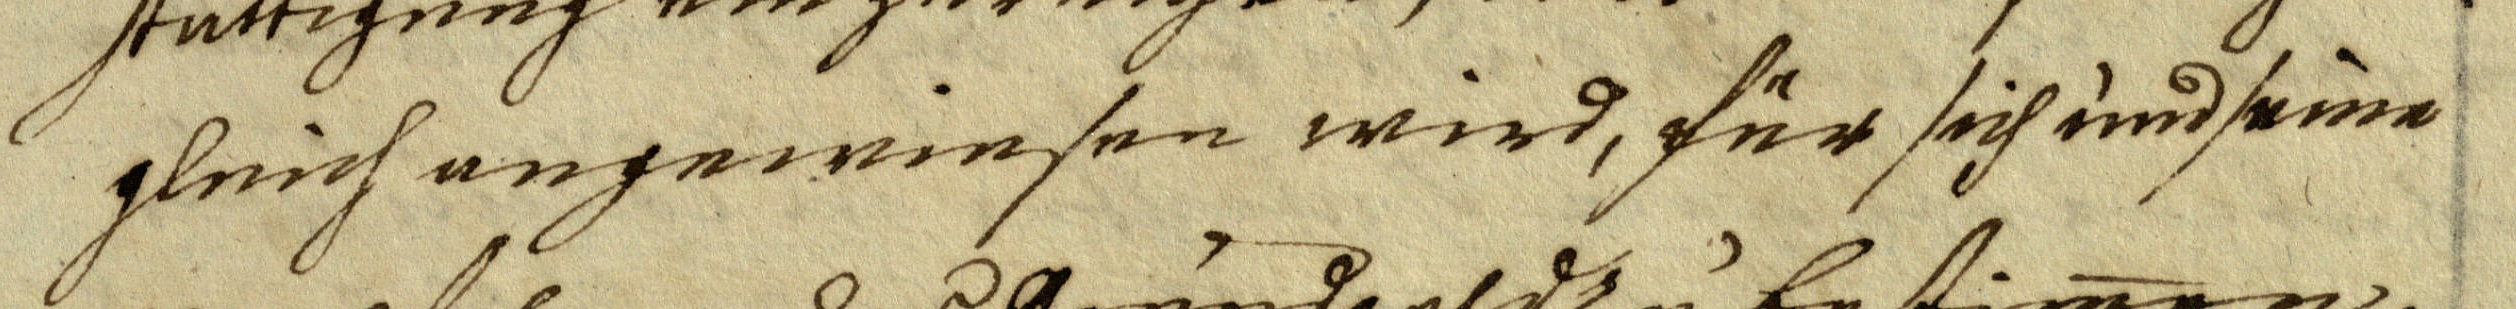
gleich angewiesen wird, für sich und seine
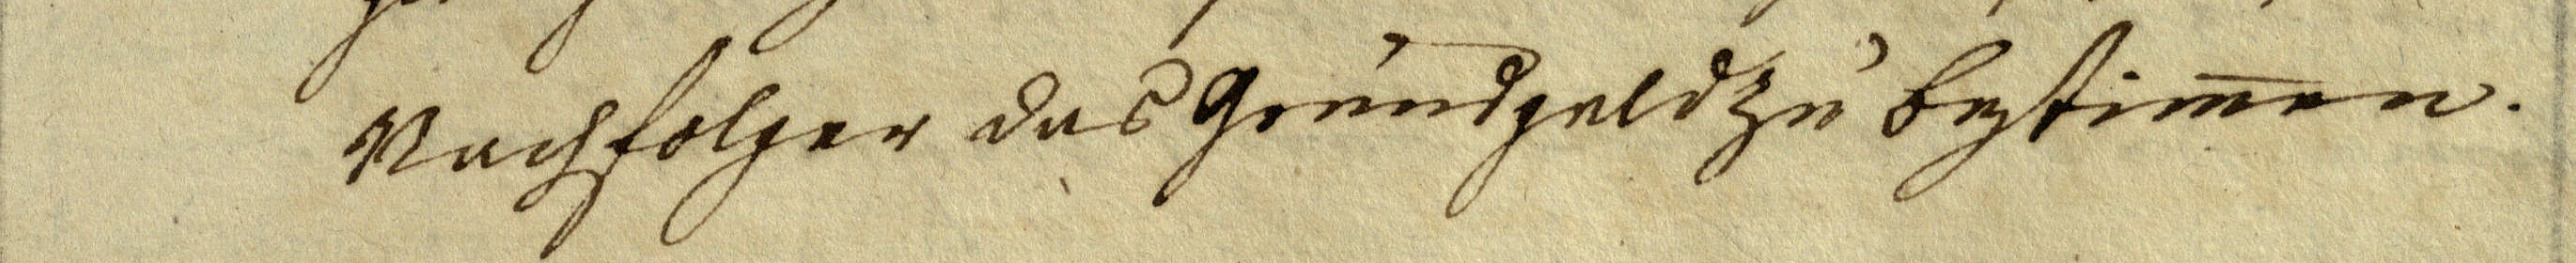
Nachfolger das Grundgeld zu bestimen.
